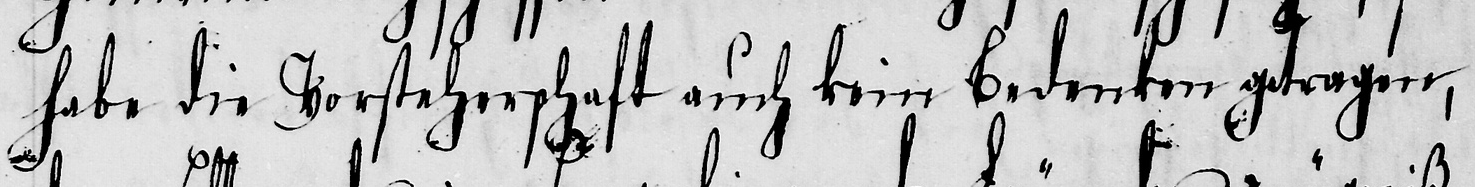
habe die Vorsteherschaft auch kein Bedenken getragen,
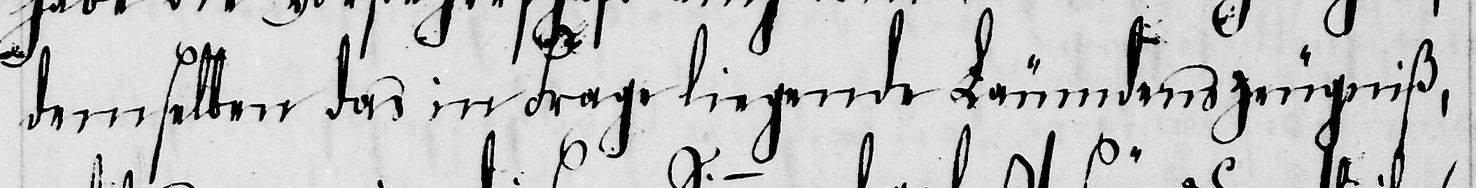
demselben das in Frage liegende Läumdenszeugniß,
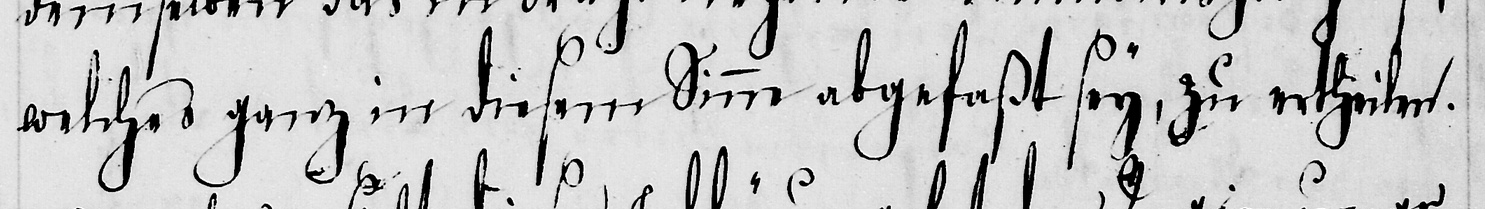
welches ganz in diesem Sinne abgefaßt sey, zu ertheilen.
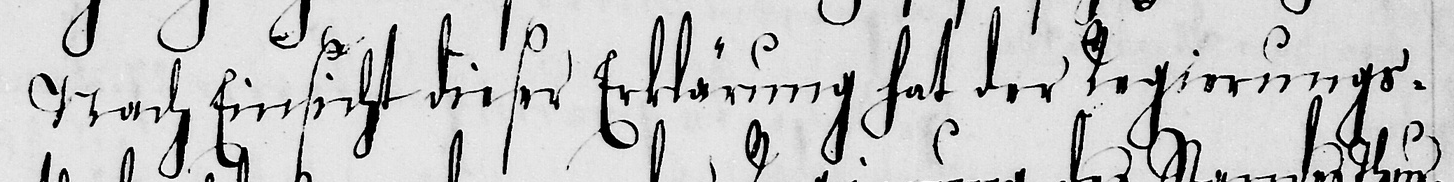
Nach Einsicht dieser Erklärung hat der Regierungs¬
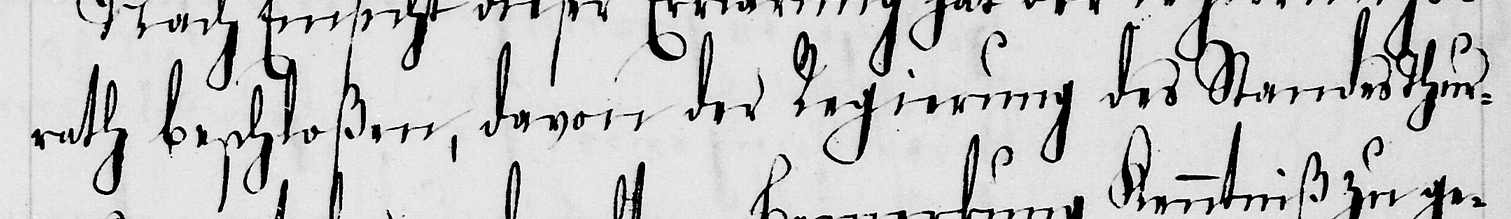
rath beschloßen, davon der Regierung des Standes Thur¬
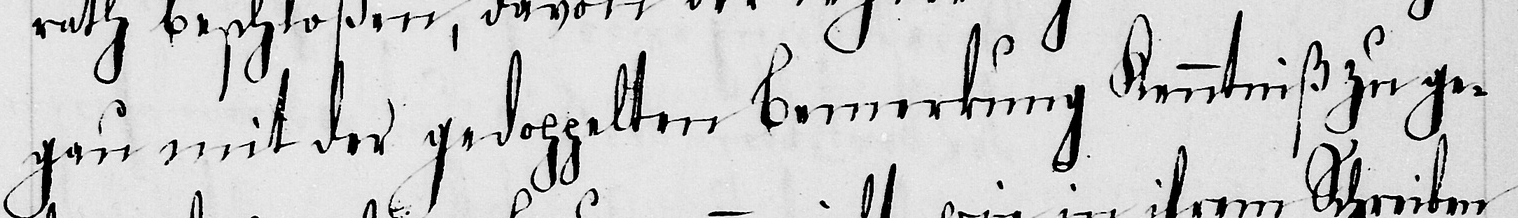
gau mit der gedoppelten Bemerkung Kenntniß zu ge¬
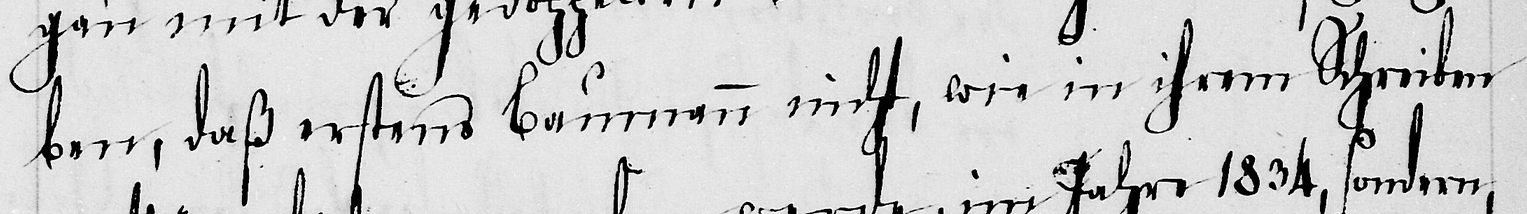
ben, daß erstens Baumann nicht, wie in ihrem Schreiben
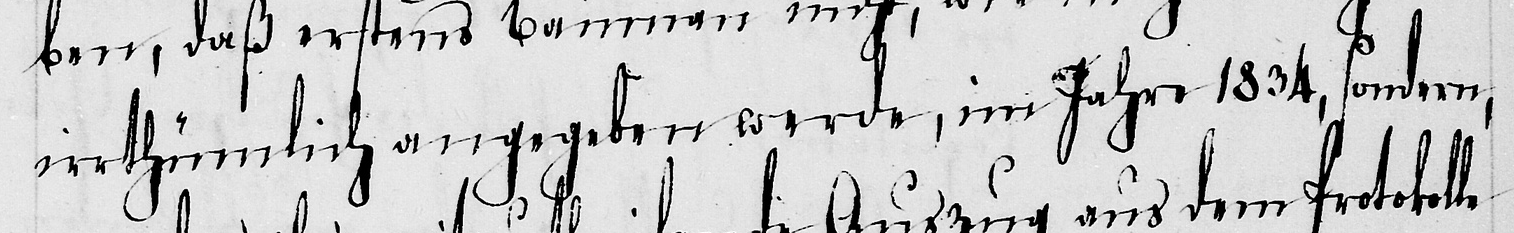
irrthümlich angegeben werde, im Jahre 1834, sondern
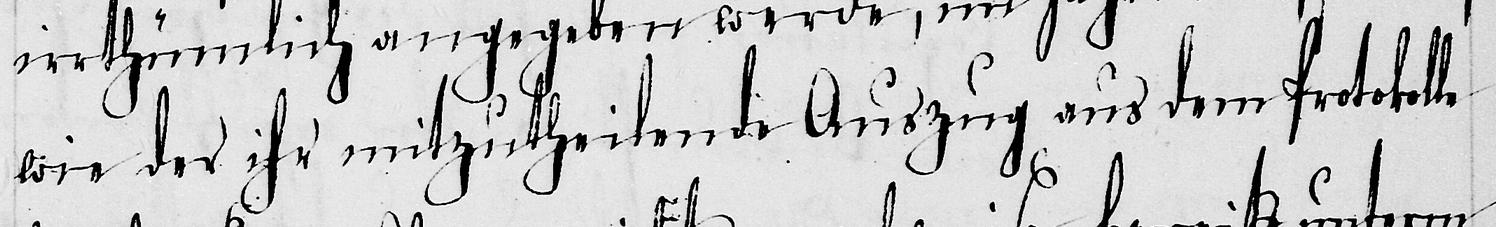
wie der ihr mitzutheilende Auszug aus dem Protokolle
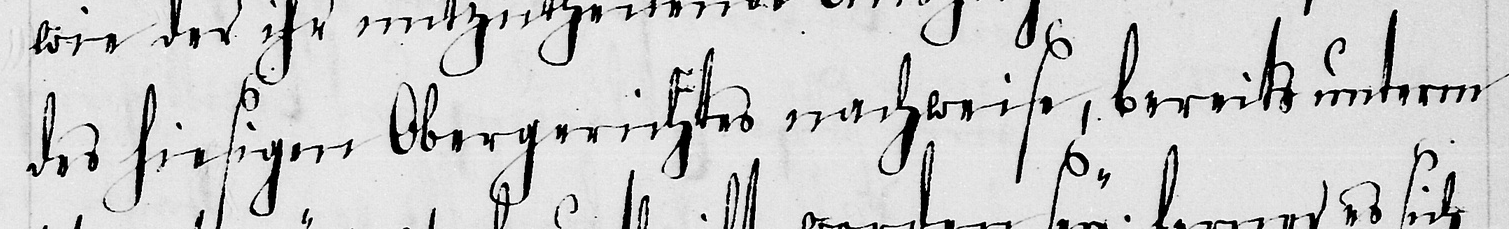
des hiesigen Obergerichtes nachweise, bereits unterm
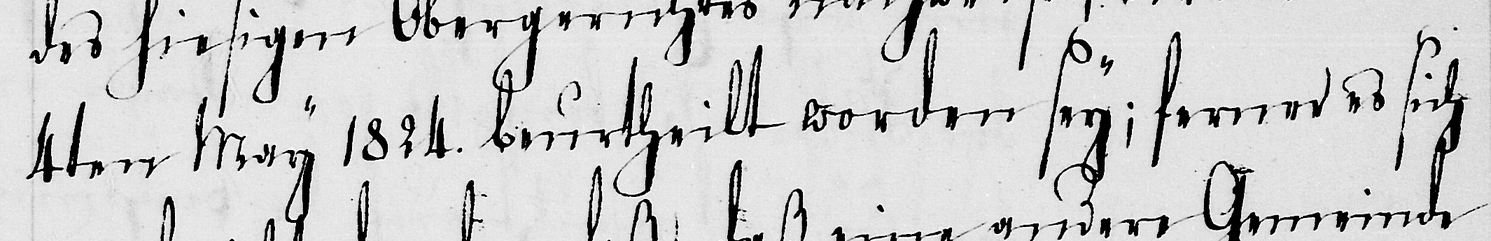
4ten. May 1824. beurtheilt worden sey; ferner es sich
